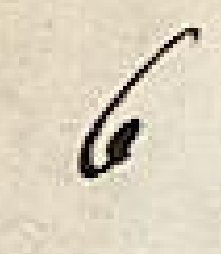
6
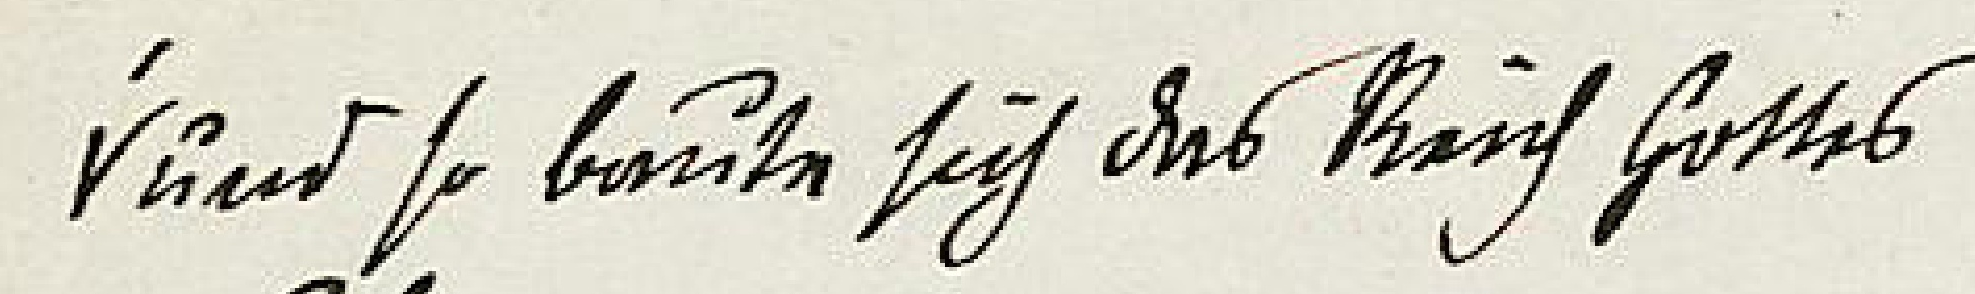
V und so baute sich das Reich Gottes
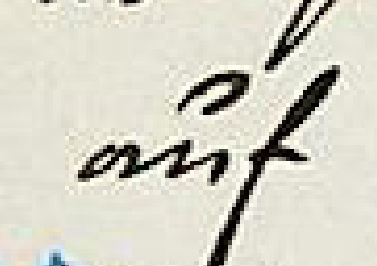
auf.
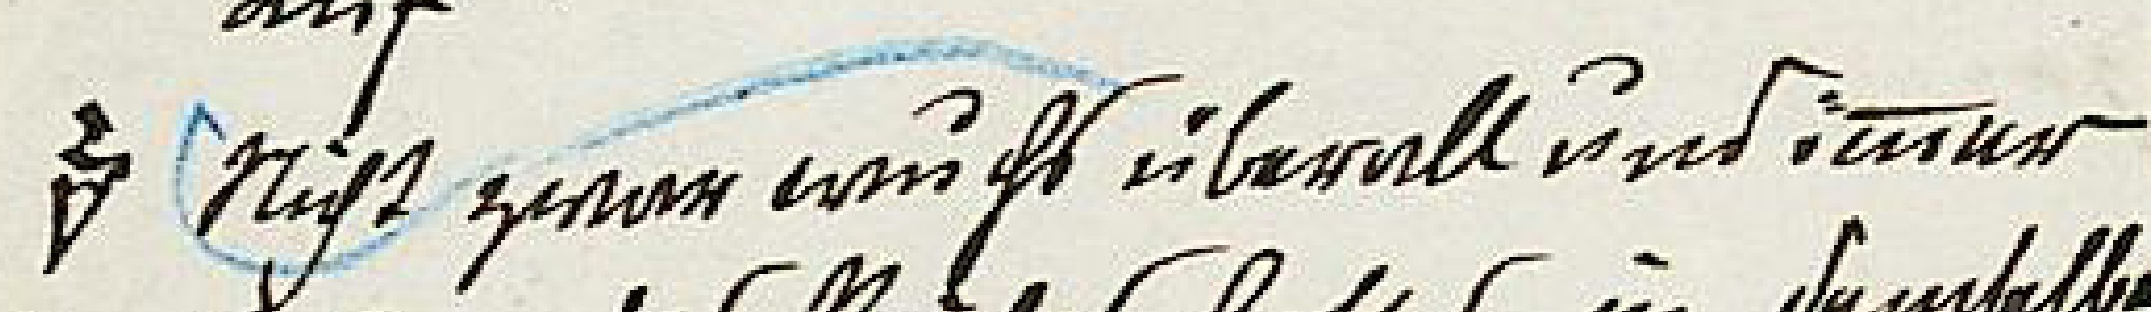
V Nicht zwar wuchs überall und imer
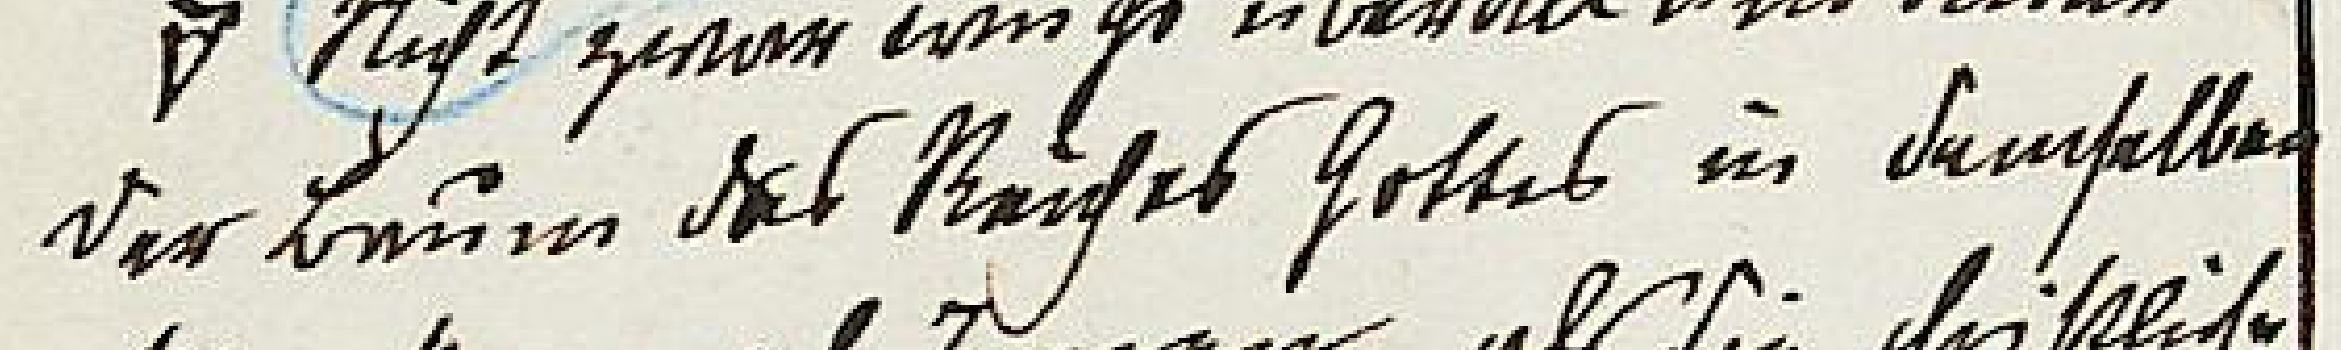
der Baum des Reiches Gottes in demselben
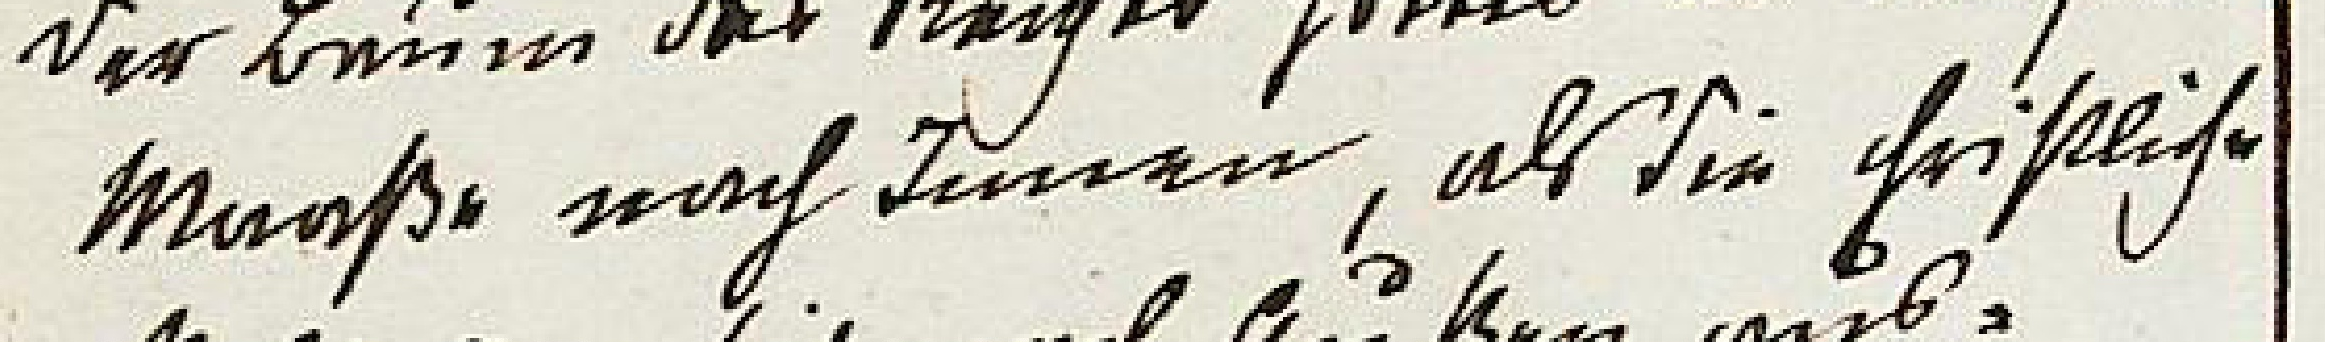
Maaße nach Innen, als die christliche
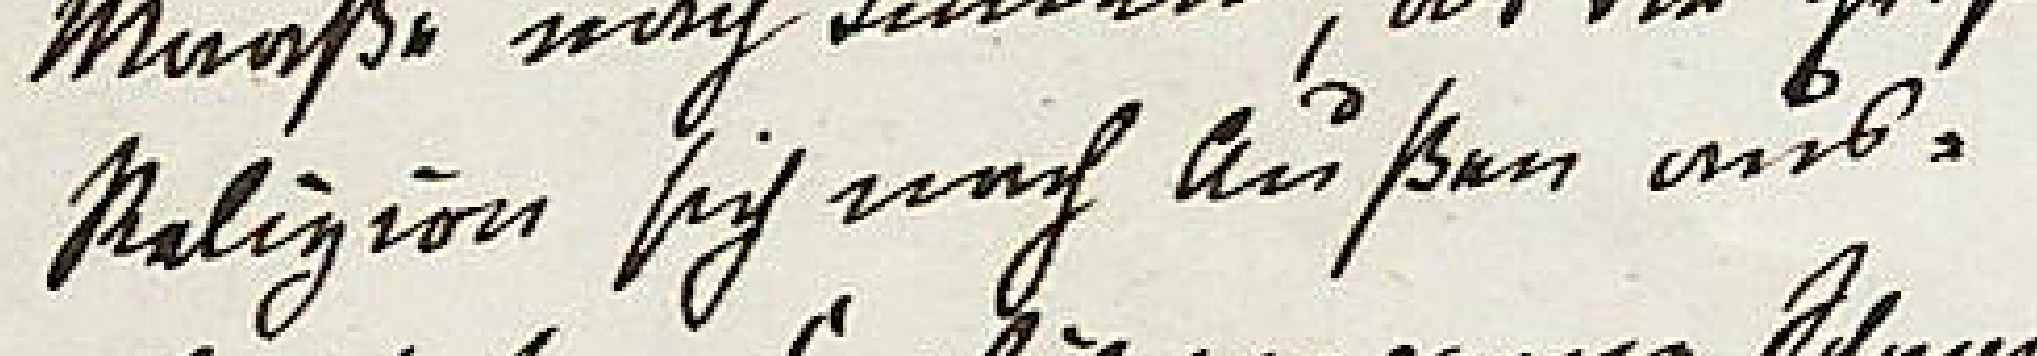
Religion sich nach Außen aus¬
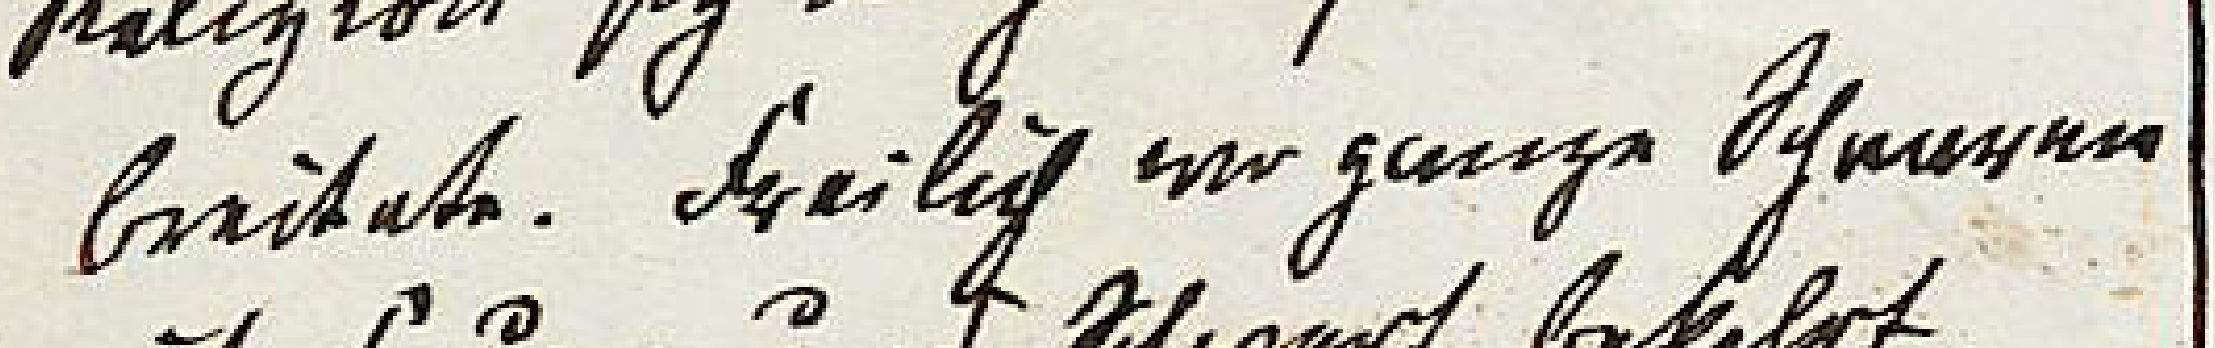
breitete. Freilich wo ganze Schaaren
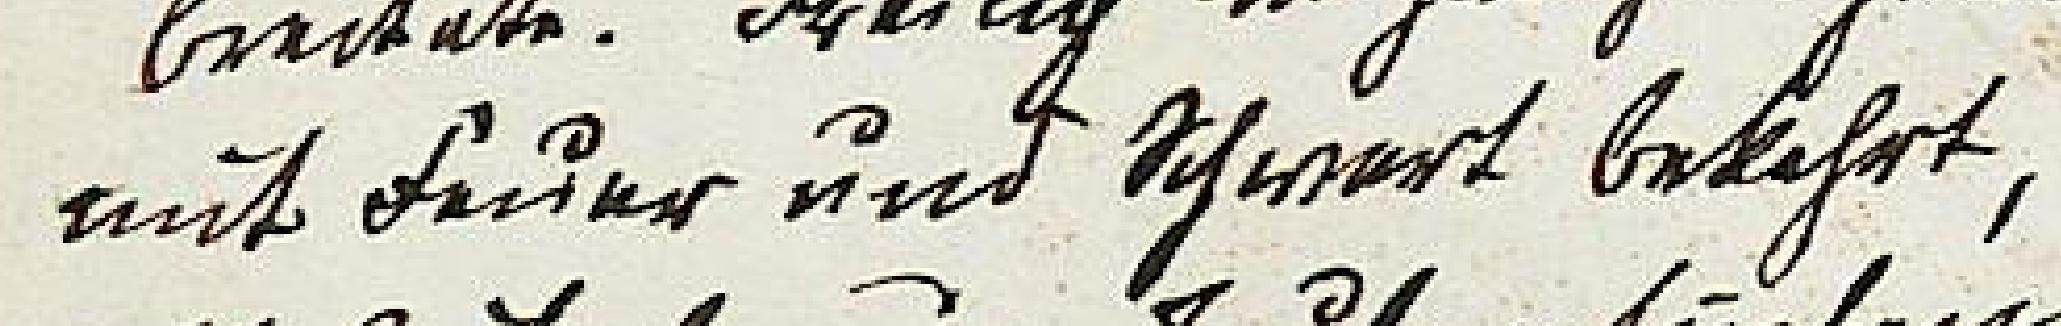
mit Feuer und Schwert bekehrt,
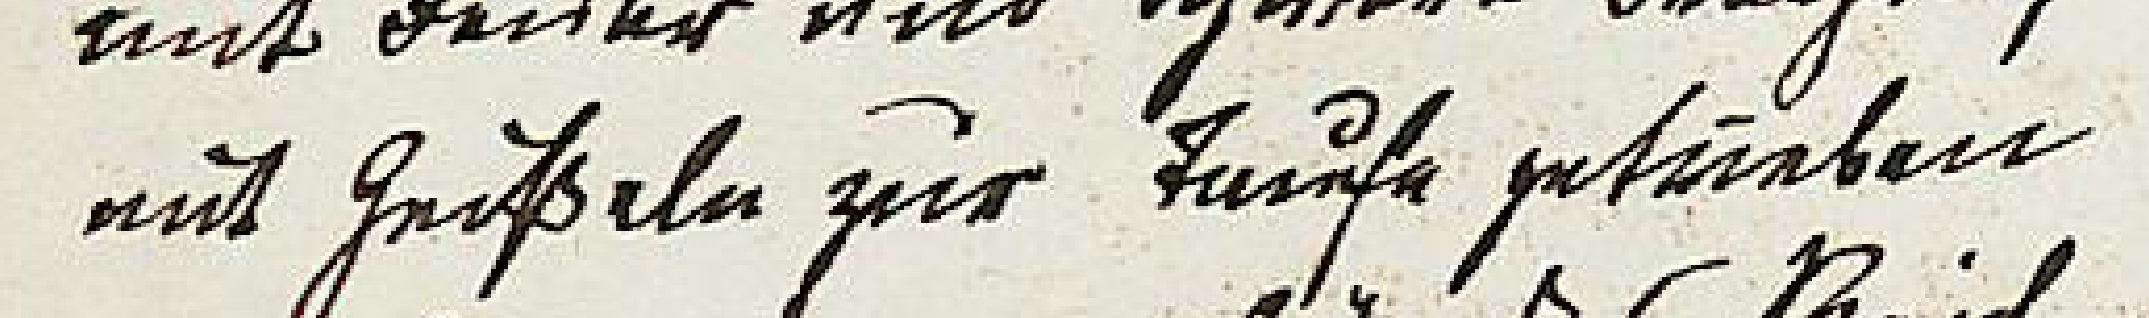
mit Geißeln zur Taufe getrieben
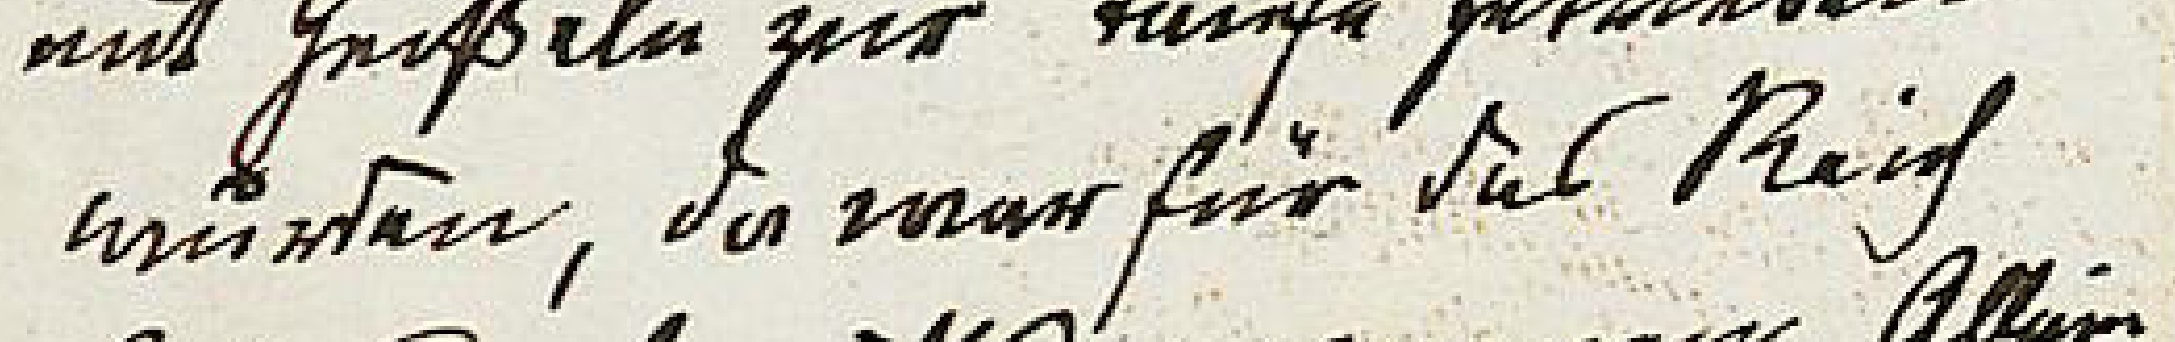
wurden, da war für das Reich
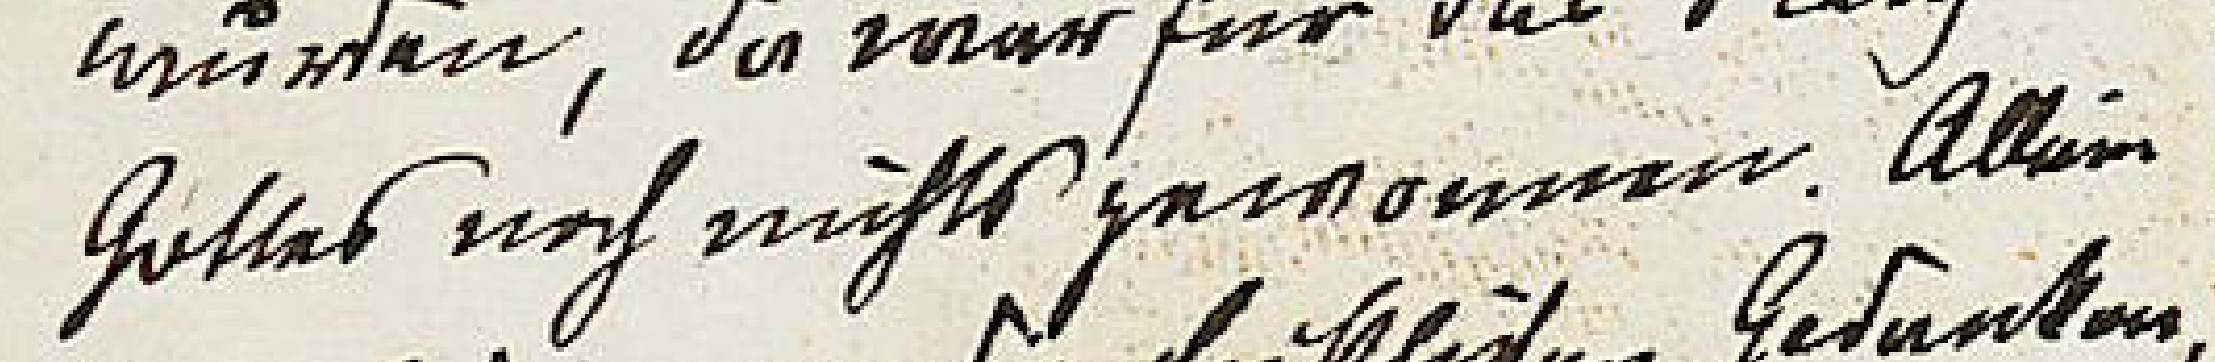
Gottes noch nichts gewonnen. Allein
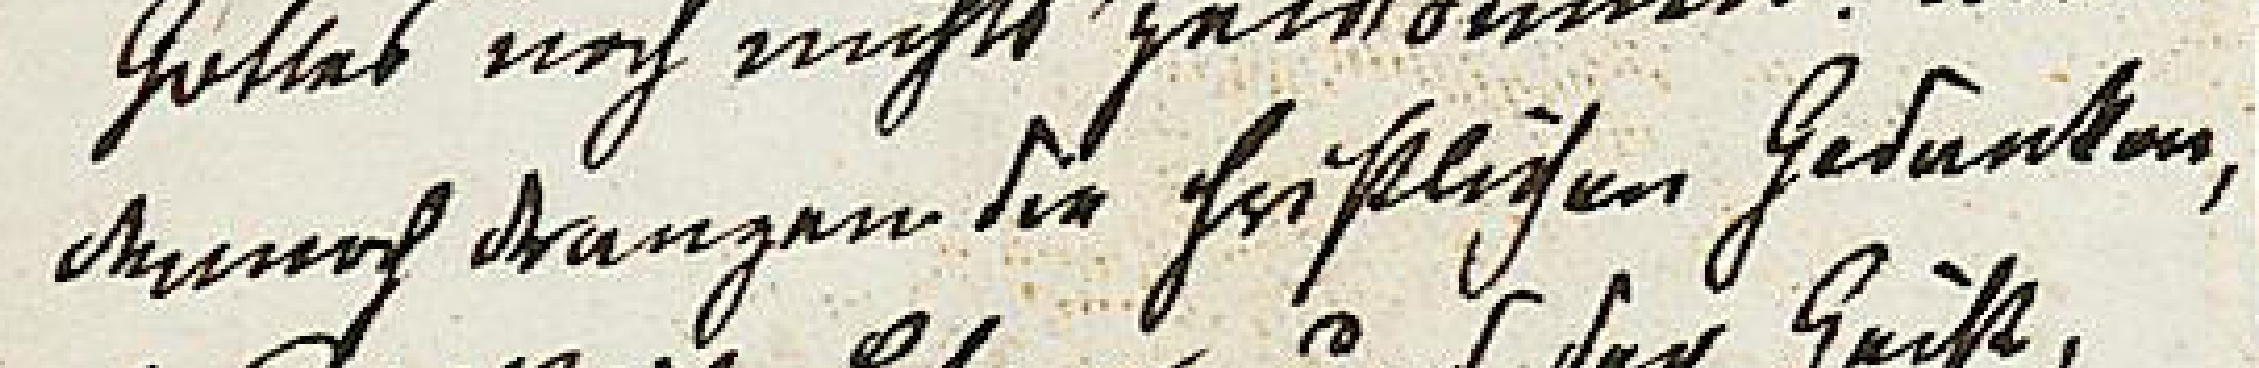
dennoch drangen die christlichen Gedanken,
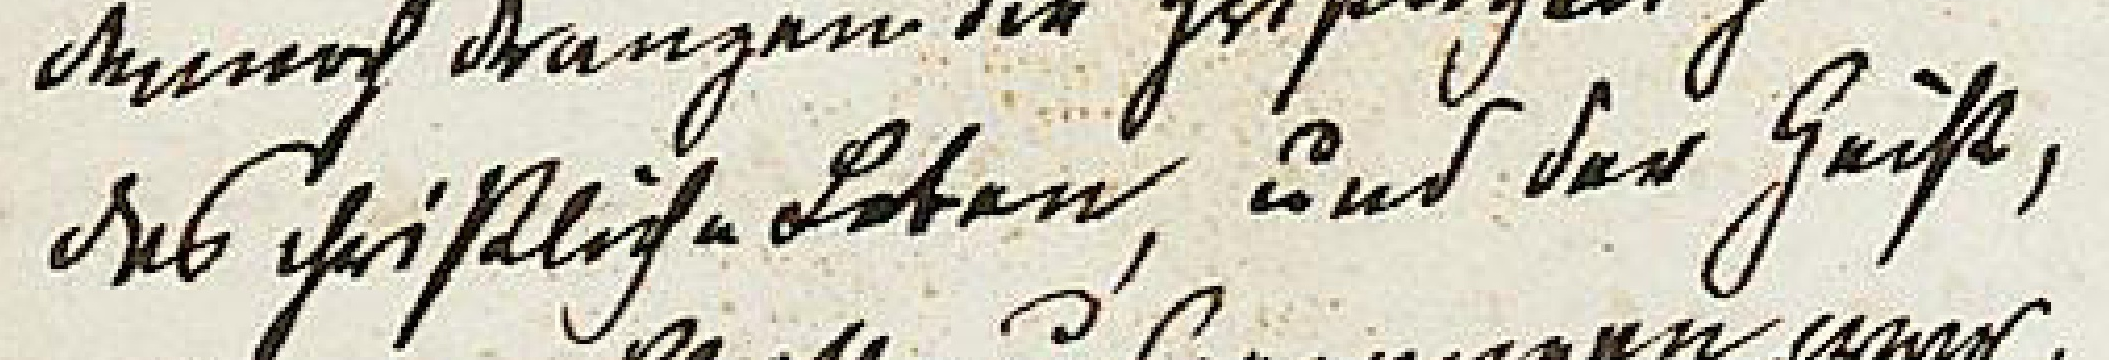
das christliche Leben, und der Geist,
